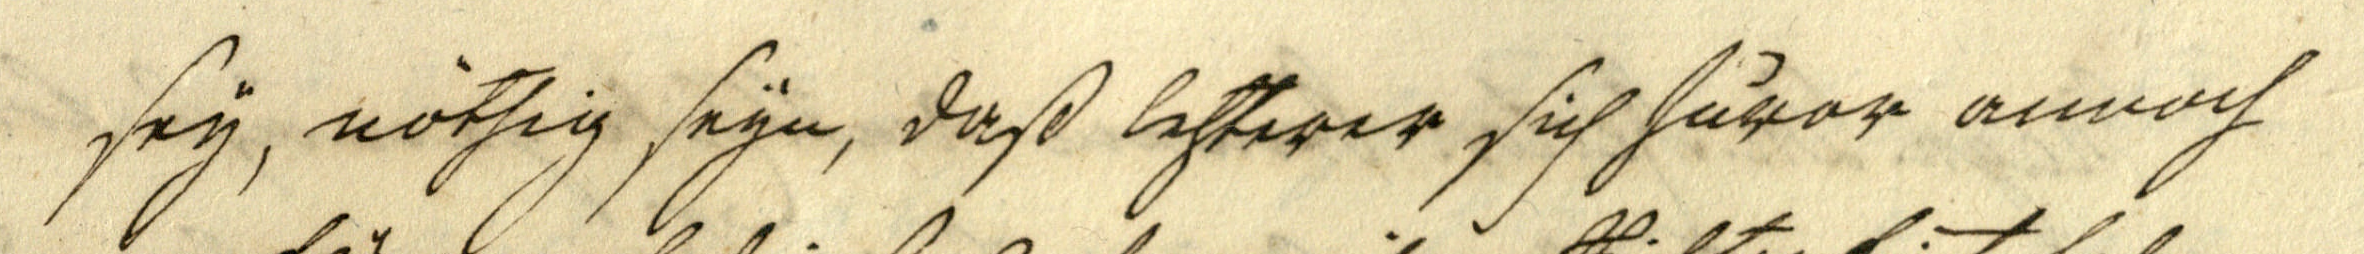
sey, nöthig seyn, daß letzterer sich zuvor annoch
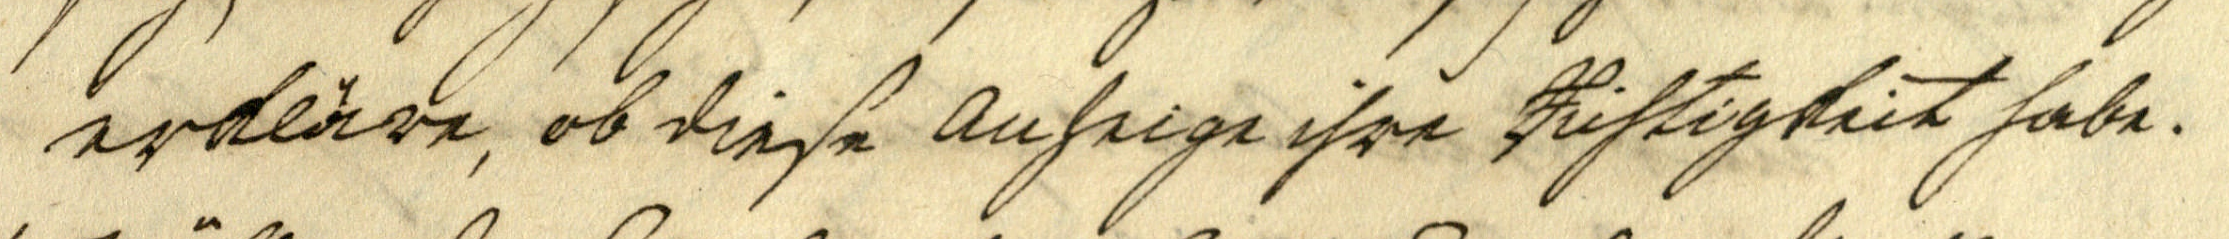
erkläre, ob diese Anzeige ihre Richtigkeit habe.
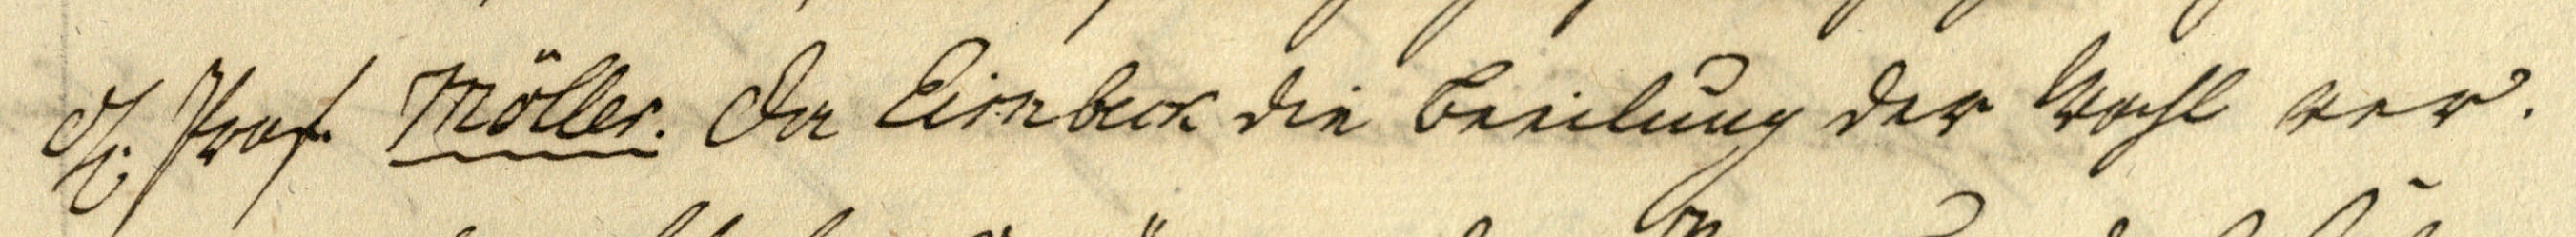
dh. Prof. Möller. Da Eimbeck die Beeilung der Wahl ver-
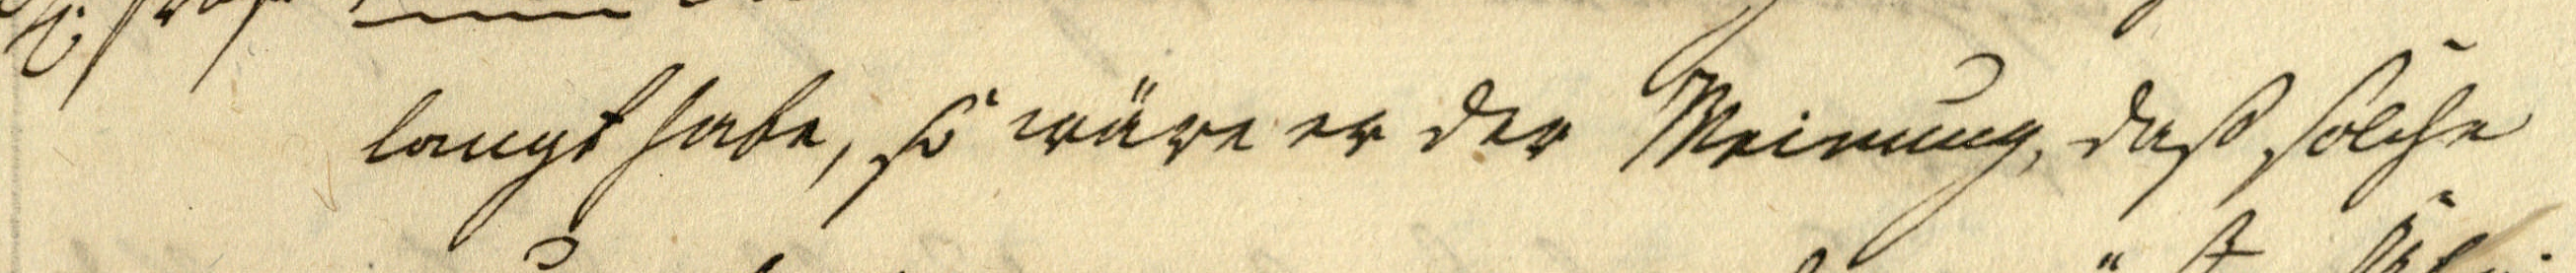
langt habe, so wäre er der Meinung, daß solche
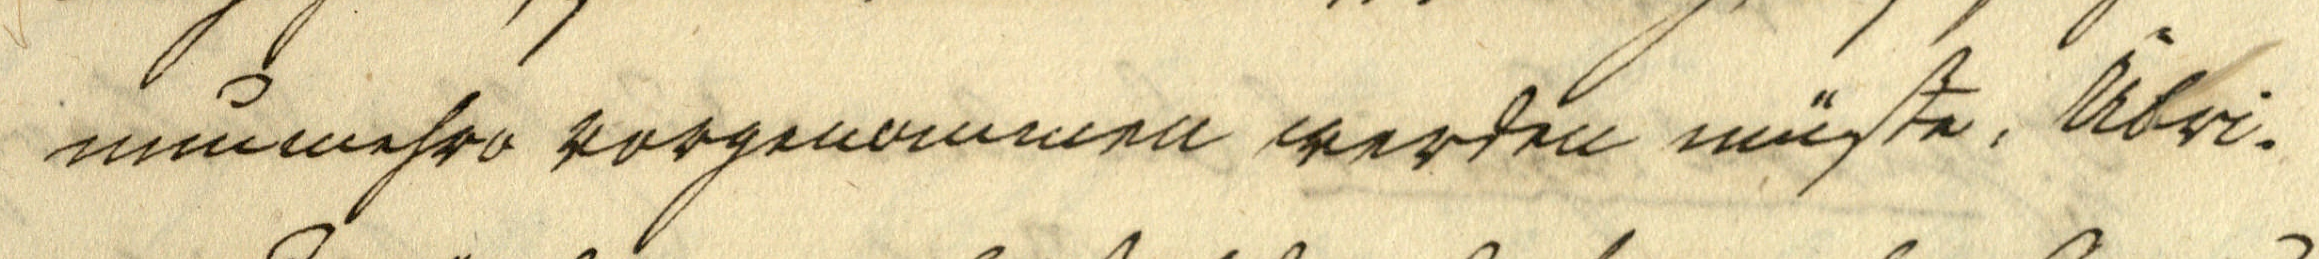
nunmehro vorgenommen werden müßte, Übri-
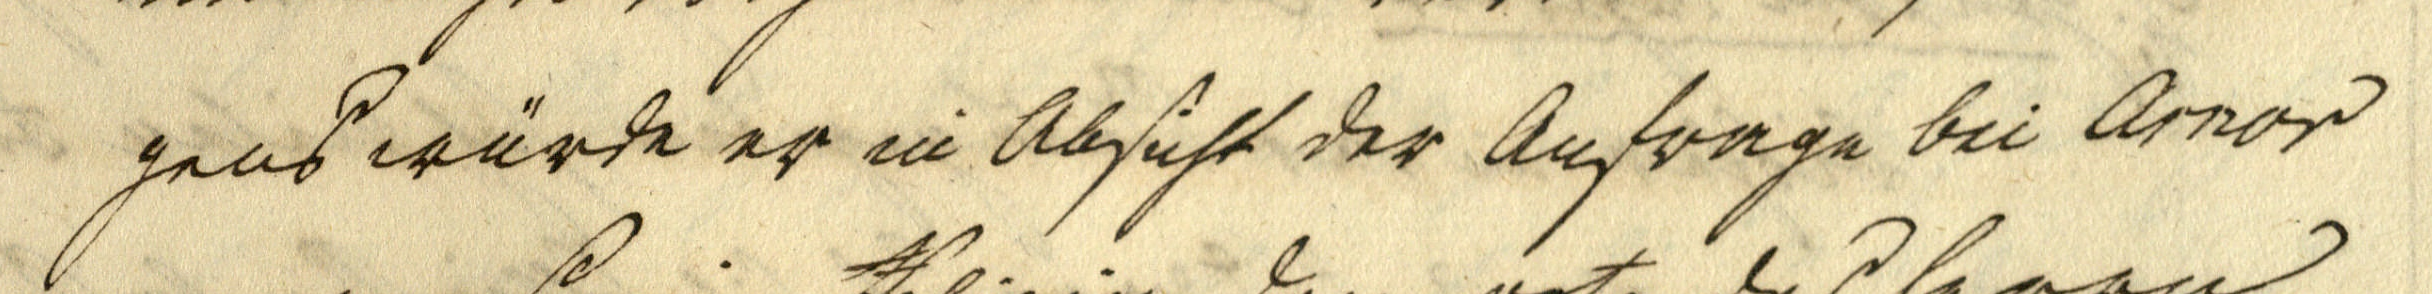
gens würde er in Absicht der Anfrage bei Amor
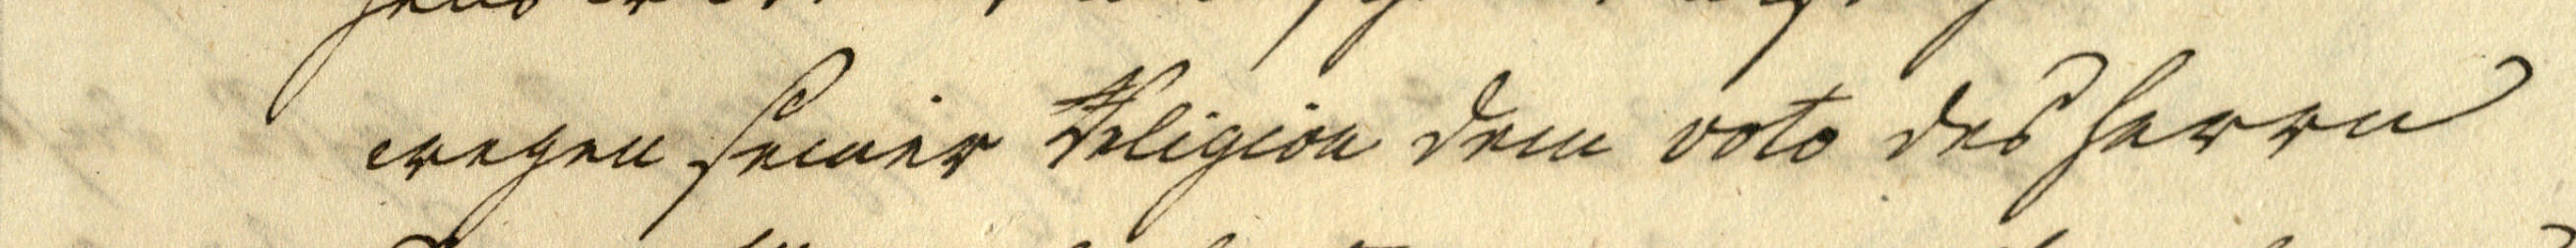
wegen seiner Religion dem voto des herrn
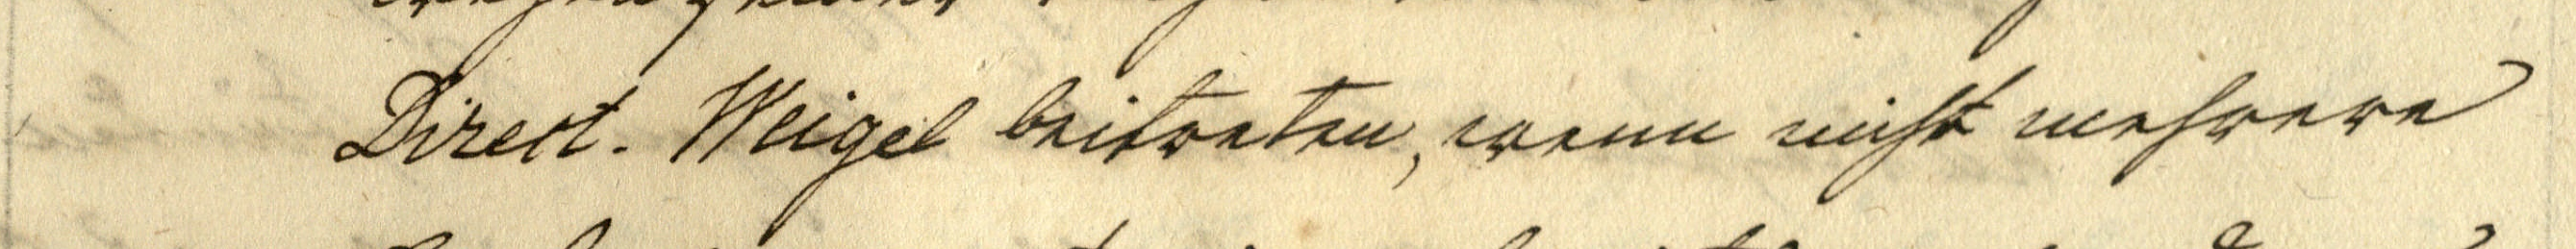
Direct. Weigel beitreten, wenn nicht mehrere
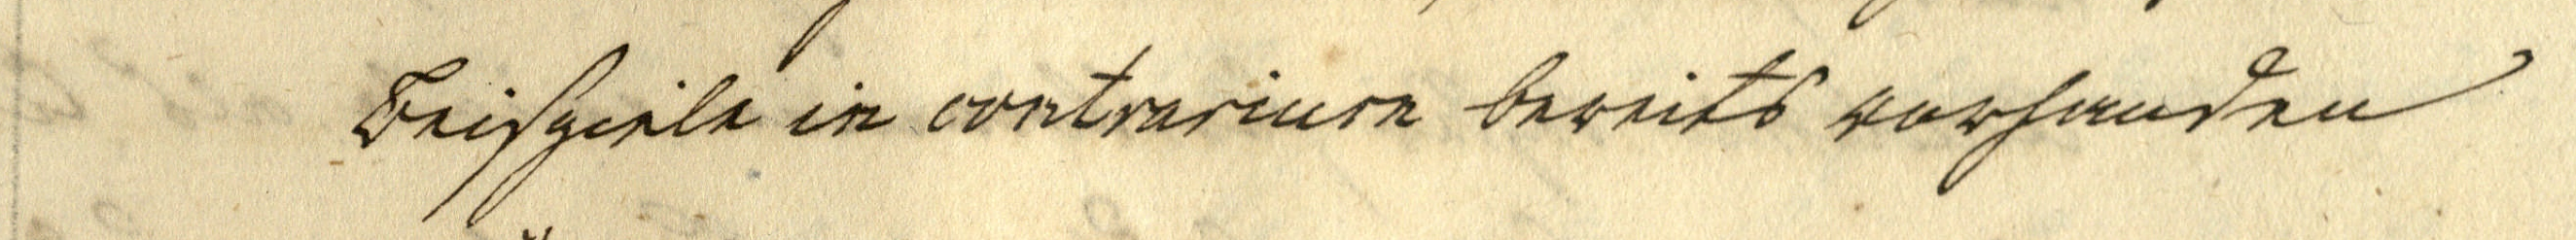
Beispiele in contrarium bereits vorhanden
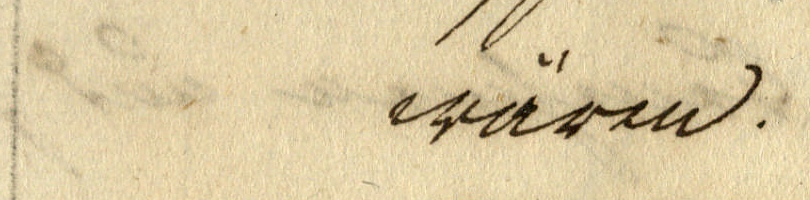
wären.
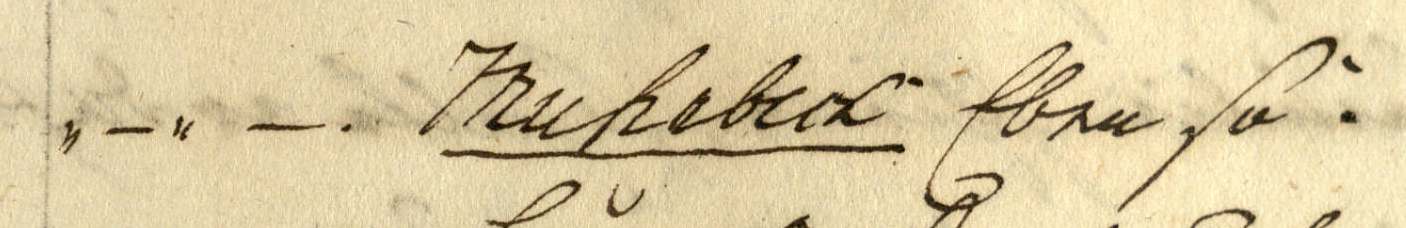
" - " - . Muhrbeck Eben so.
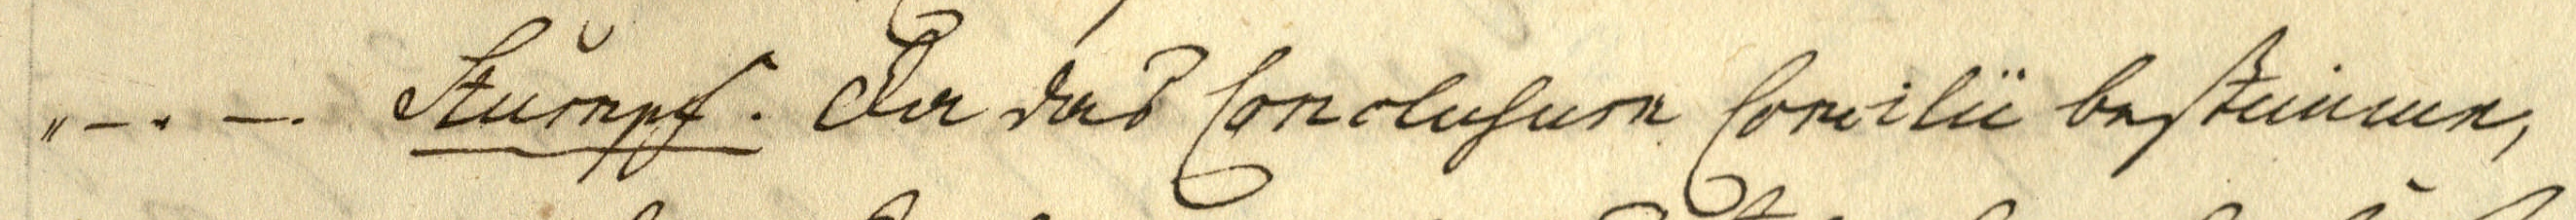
" - " - . Stumpf. Da das Conclusum Concilii bestimme,
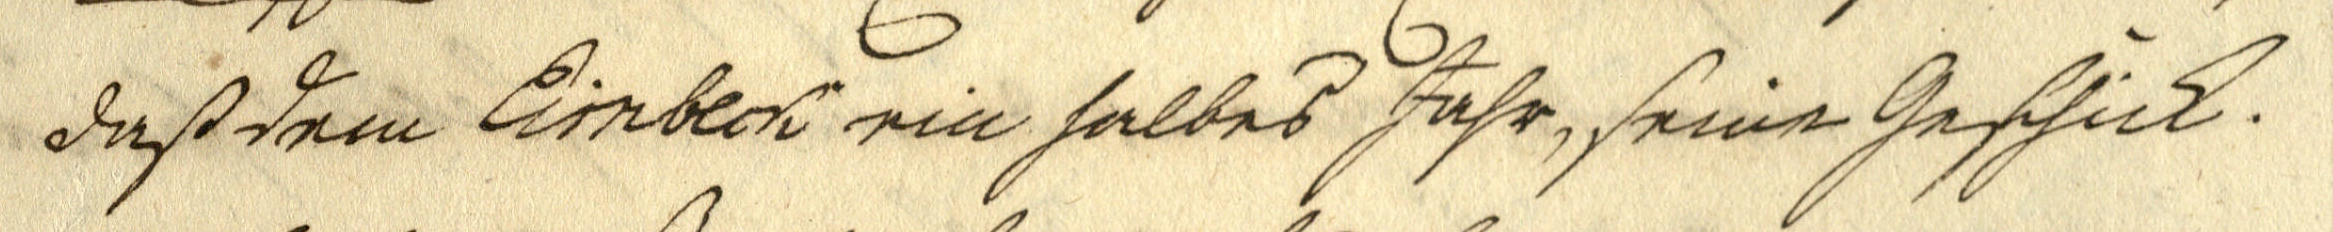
daß dem Eimbeck ein halbes Jahr, seine Geschick-
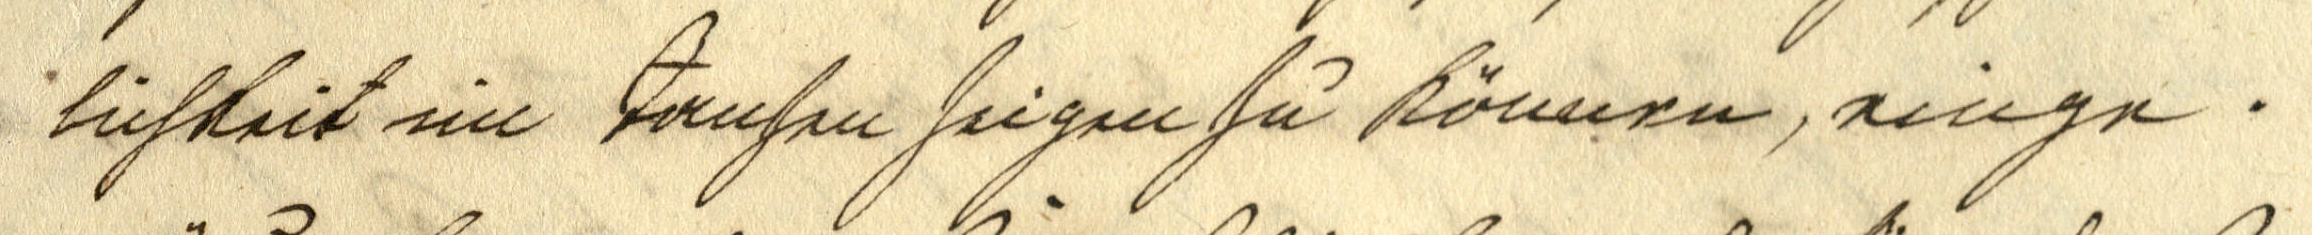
lichkeit im Tanzen zeigen zu können, einge-
